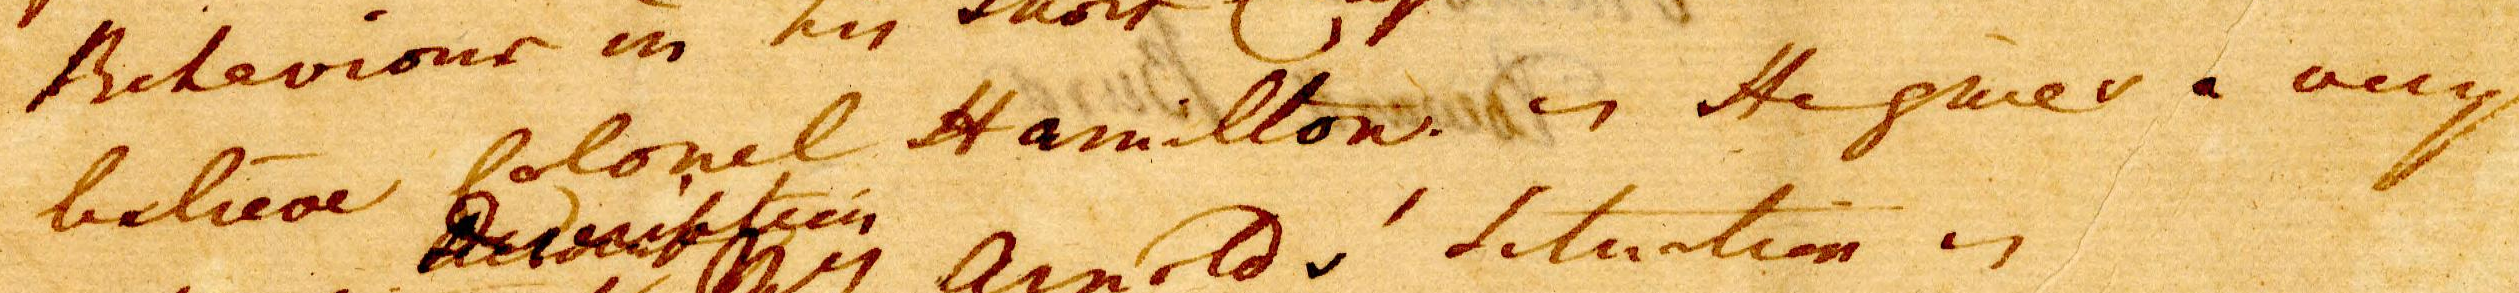believe Colonel Hamilton. He gives a very
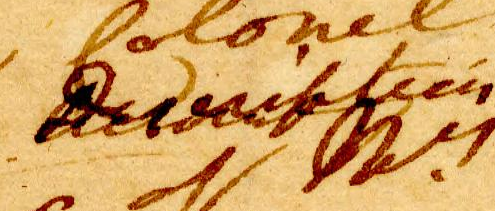Description
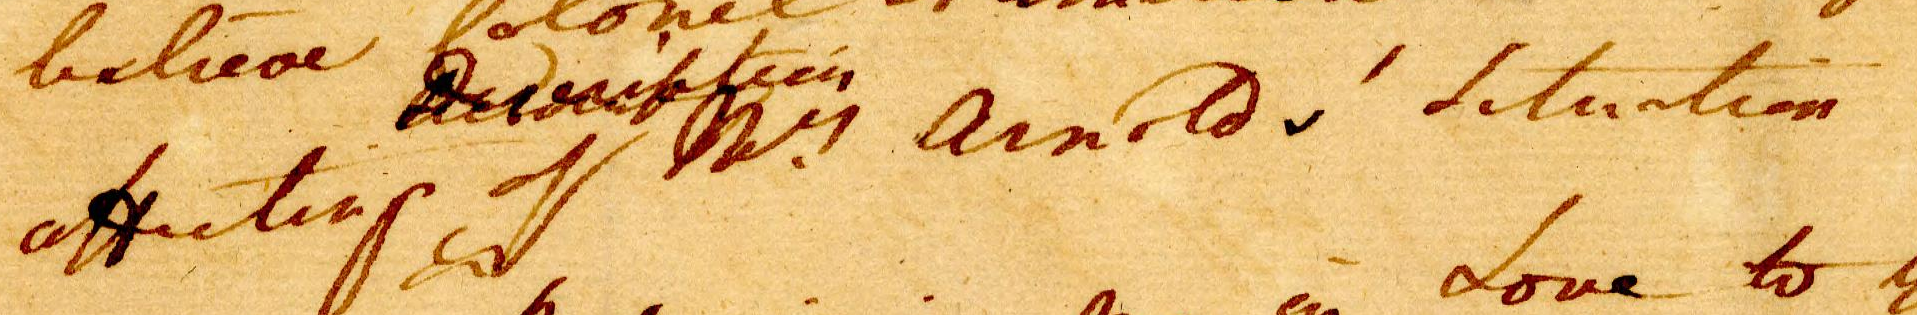affecting ^ of Mr^s. Arnolds' Situation.
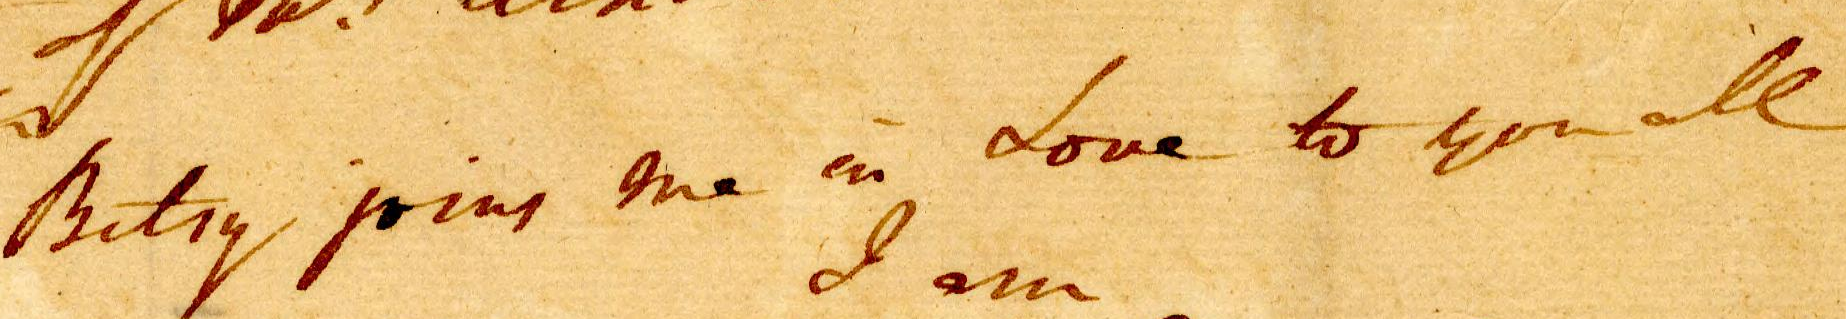Betsy joins me in Love to you all
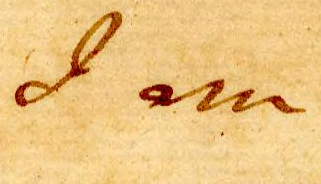I am
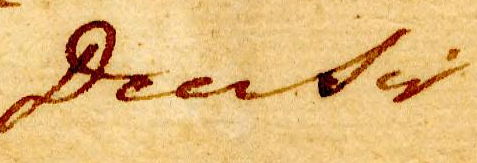Dear Sir
